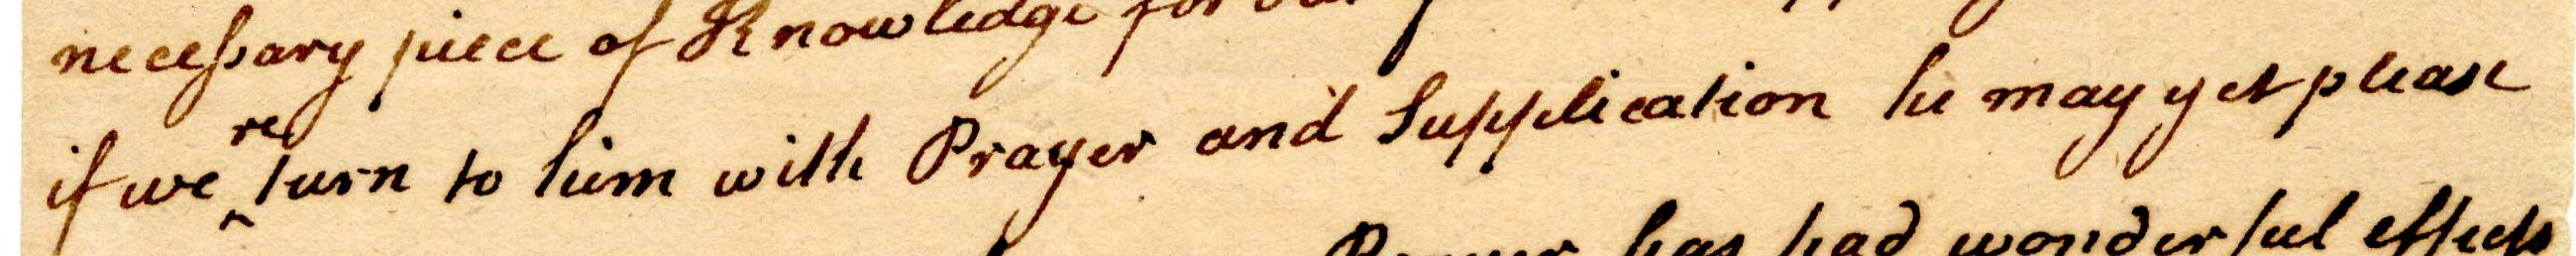if we ^turn to him with Prayer and Supplication he may yet please
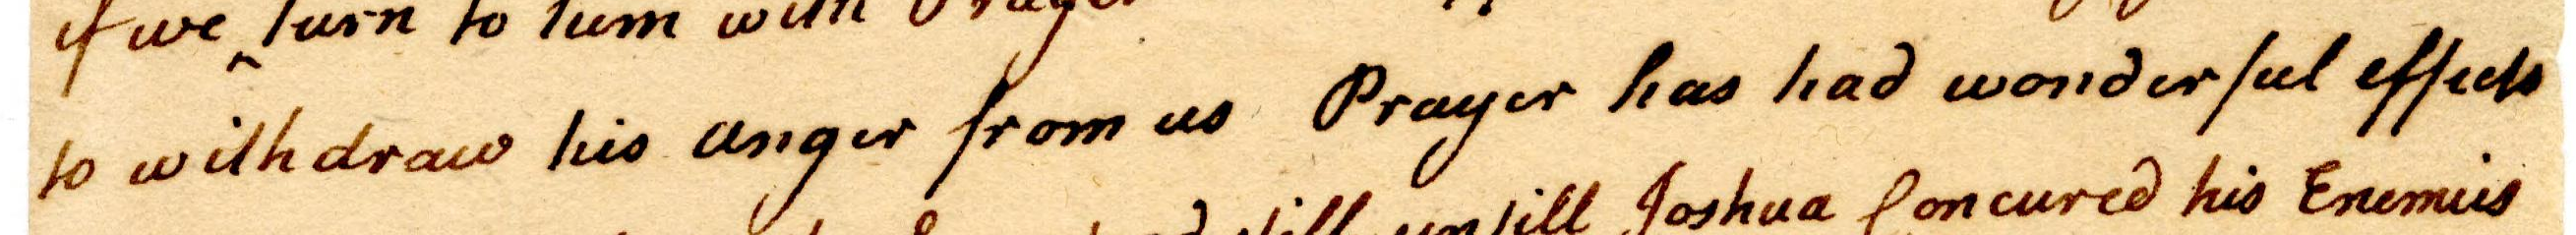to withdraw his anger from us Prayer has had wonderful effects
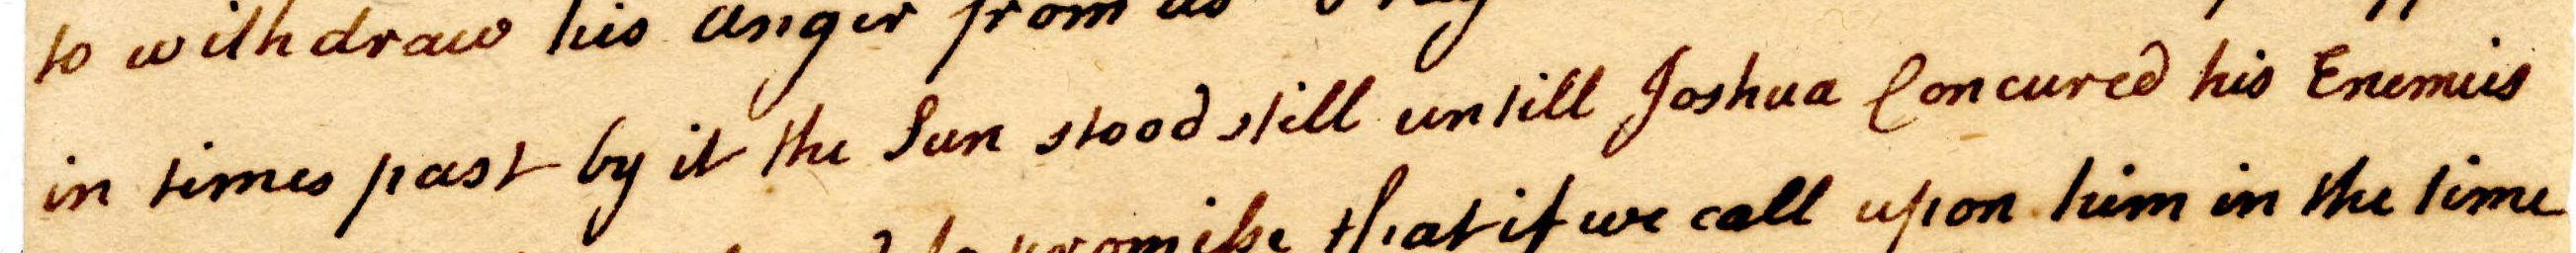in times past by it the Sun stood still untill Joshua Concured his Enemies
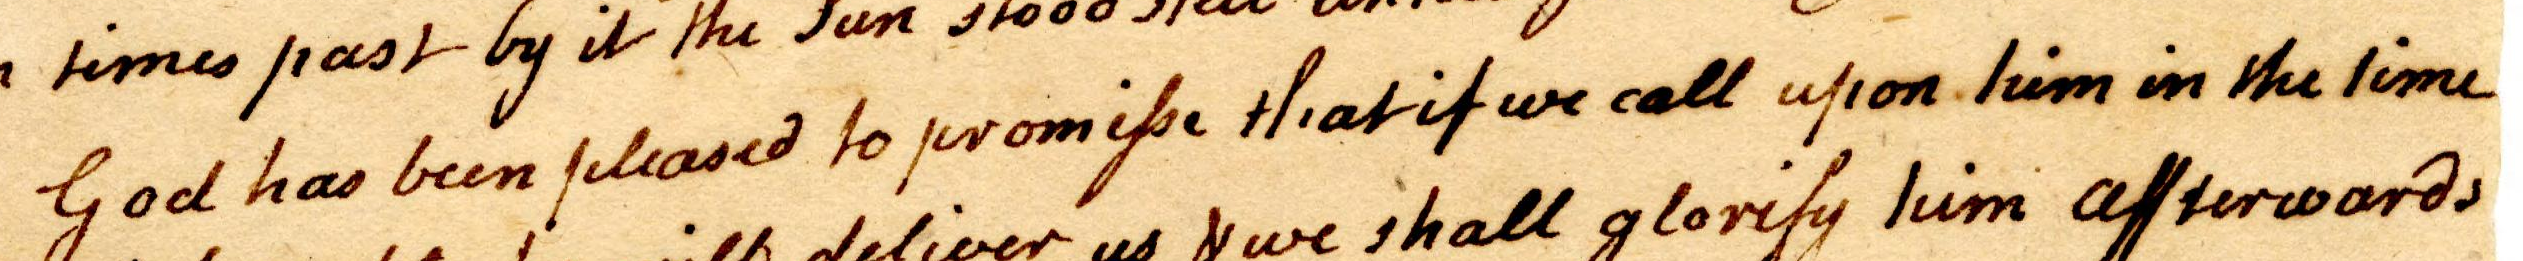God has been pleased to promisse that if we call upon him in the time
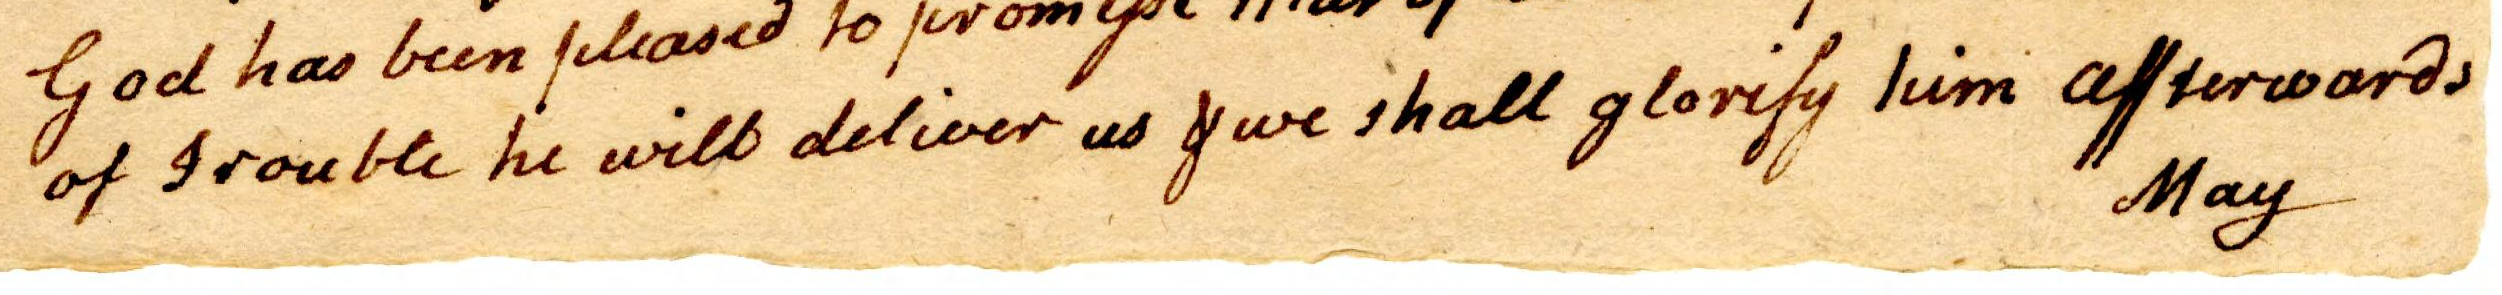of trouble he will deliver us & we shall glorify him affterwards
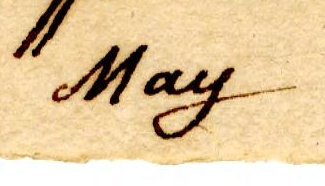May
